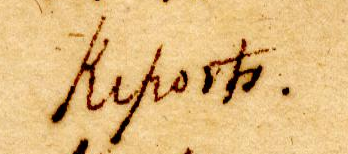Reports.
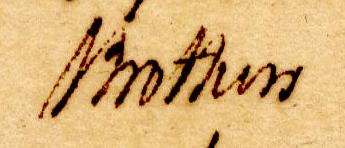Brothers
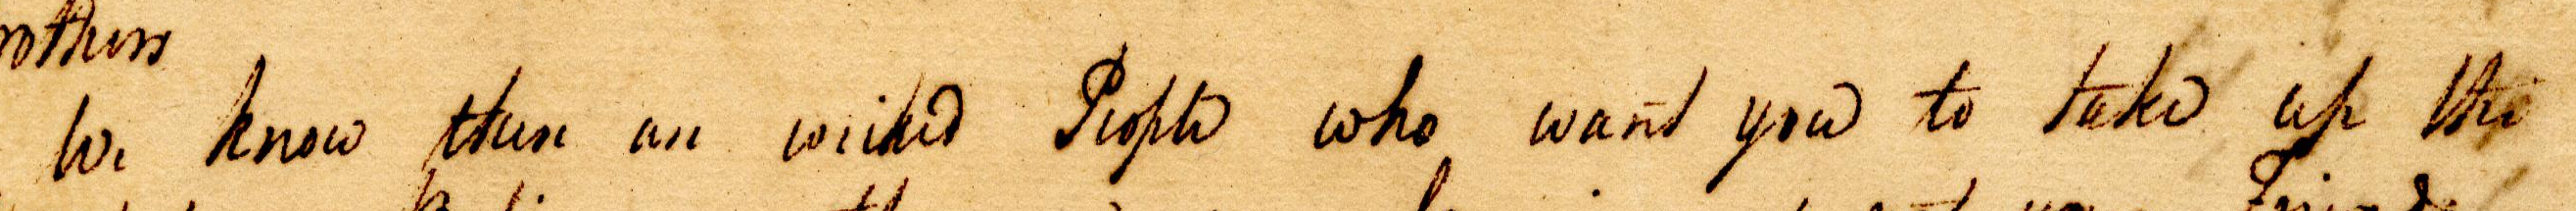We know there are wicked People who want you to take up the
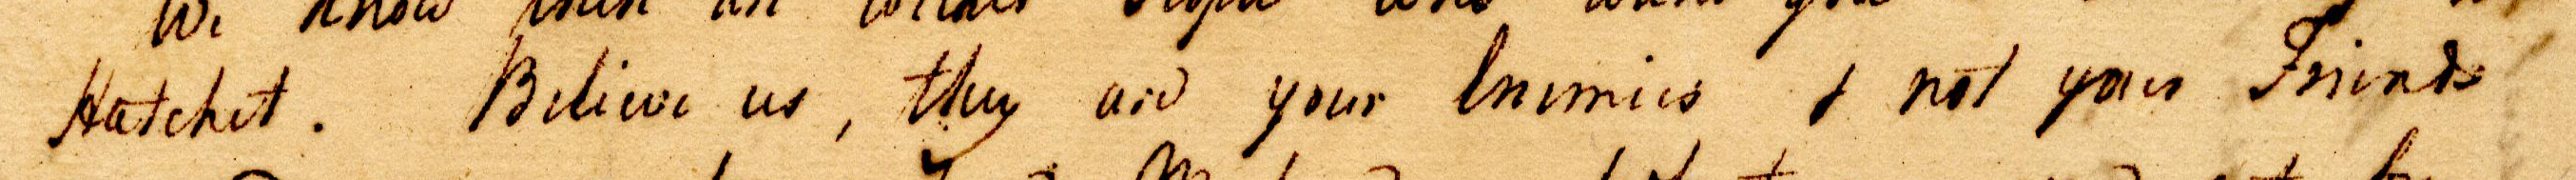Hatchet. Believe us, they are your Enemies & not your Friends
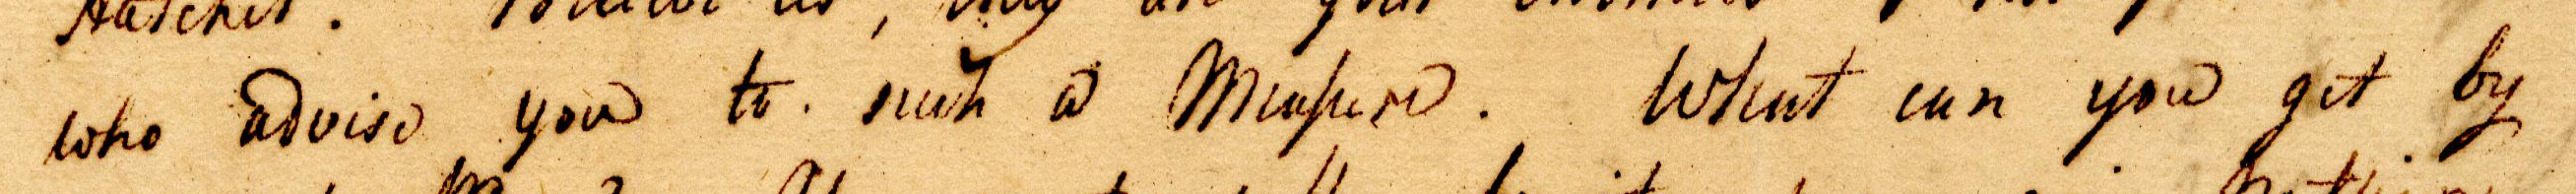who advise you to such a Measure. What can you get by
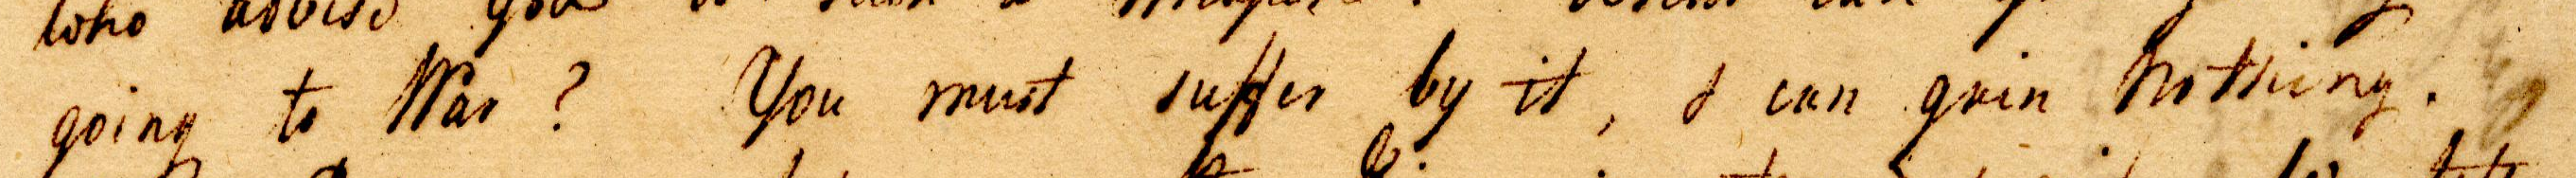going to War? You must suffer by it, & can gain Nothing.
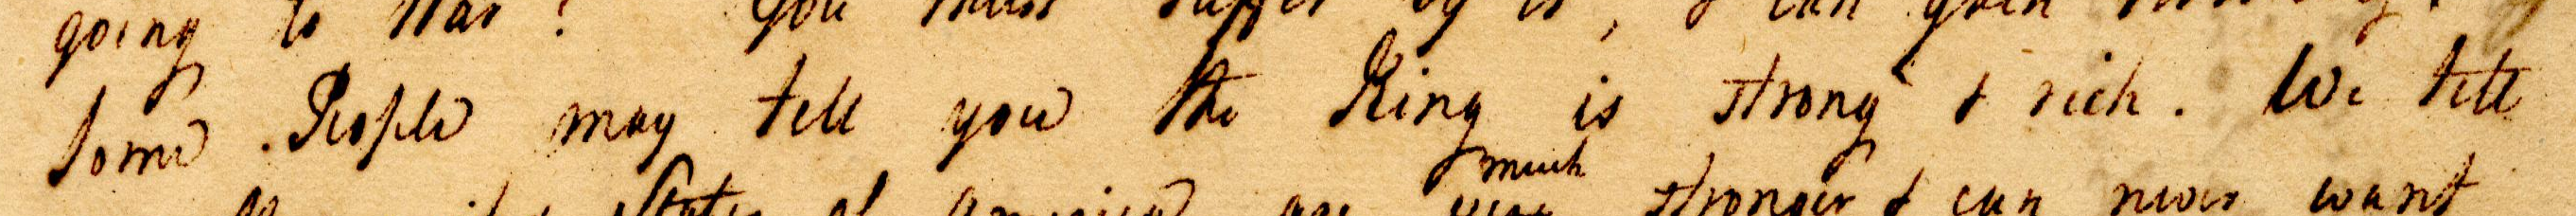Some People may tell you the King is strong & rich. We tell
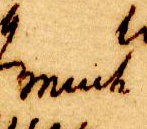much
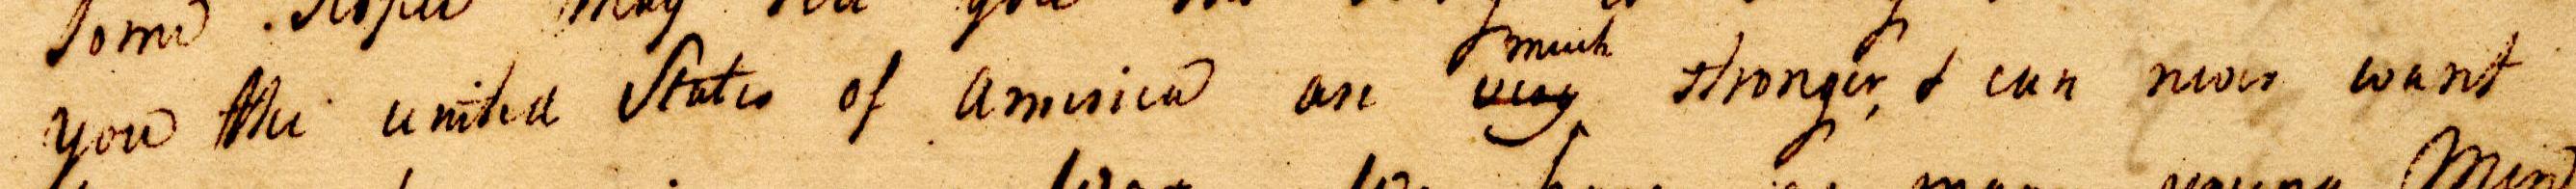you the united States of America are very^ stronger, & can never want
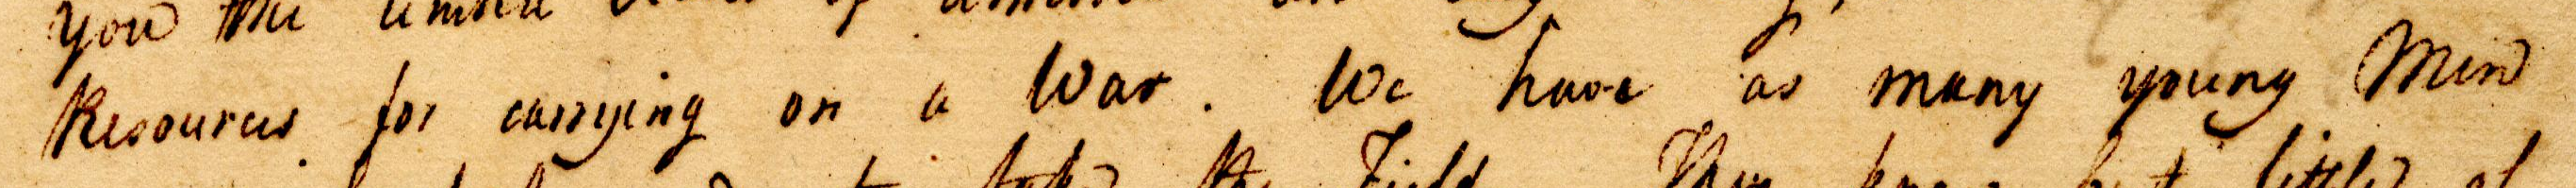Resources for carrying on a War. We have as many young Men
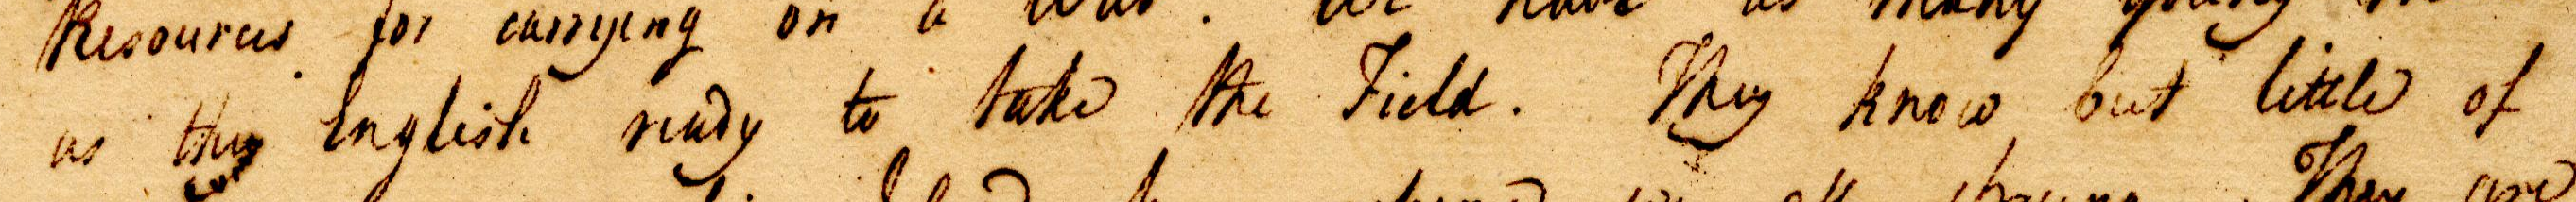as the English ready to take the Field. They know but little of
